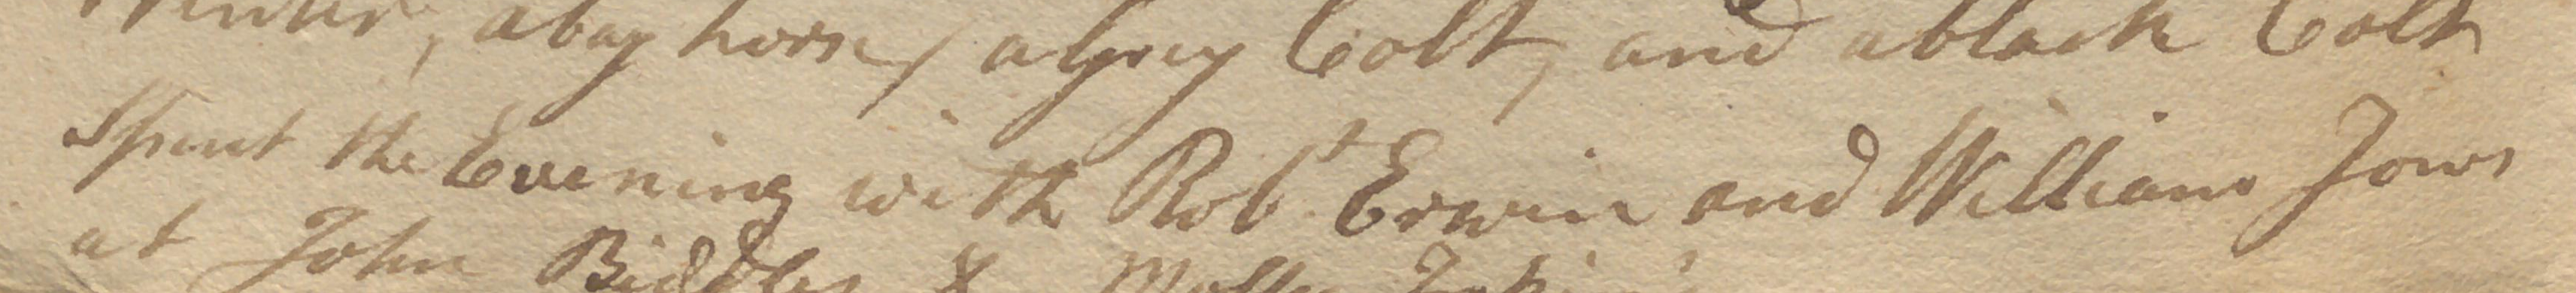spent the Evening with Rob^t. Erwin and William Jones
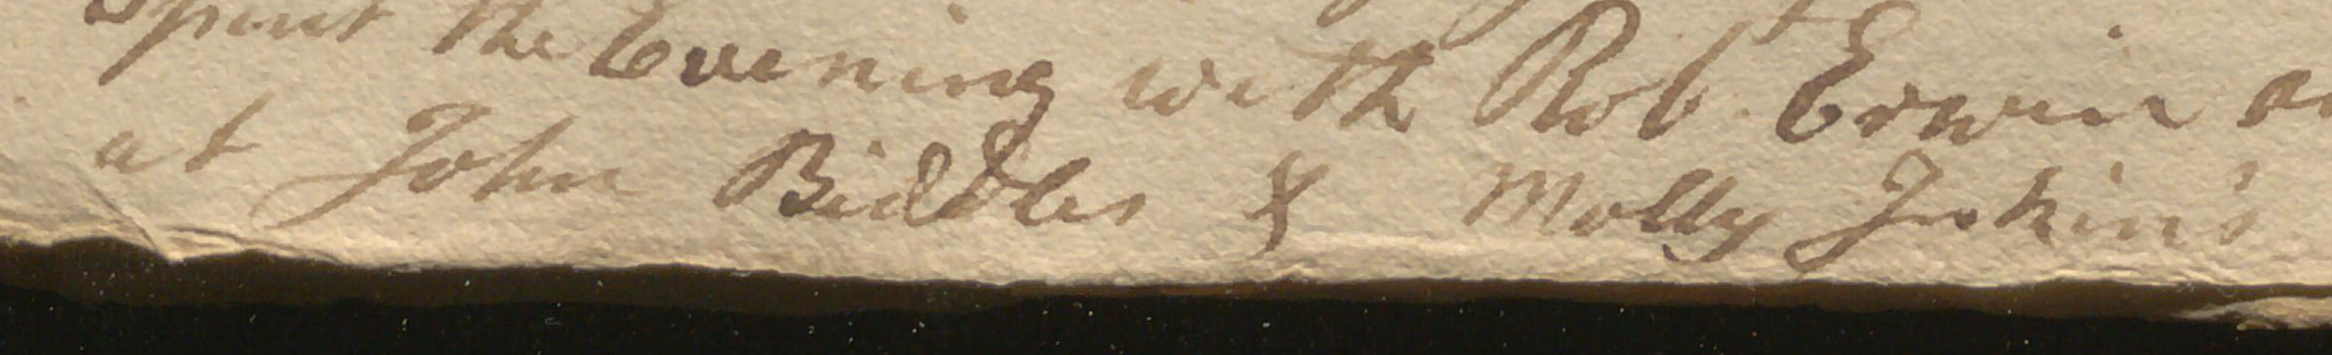at John Biddles & Molly Inkin's
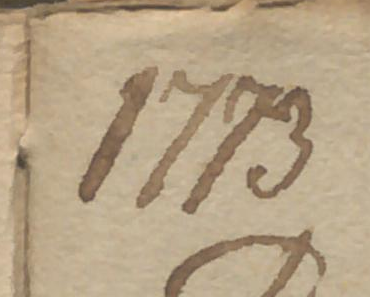1773
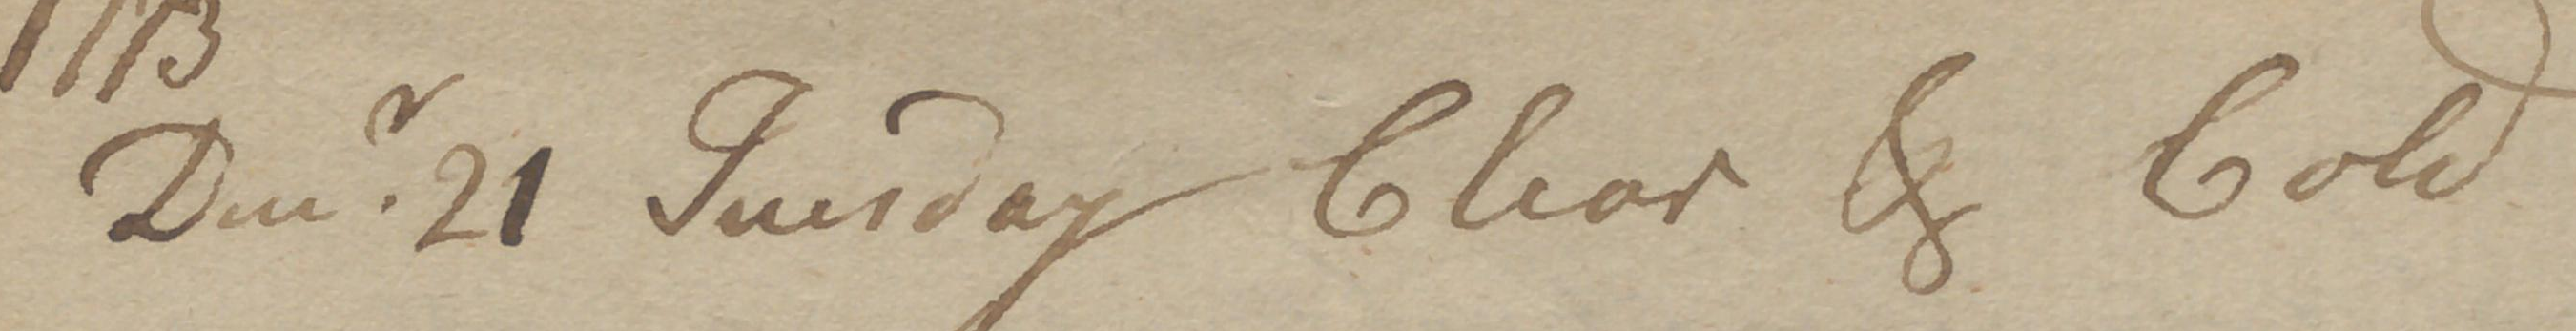Dece^r. 21^th Tuesday Clear & Cold
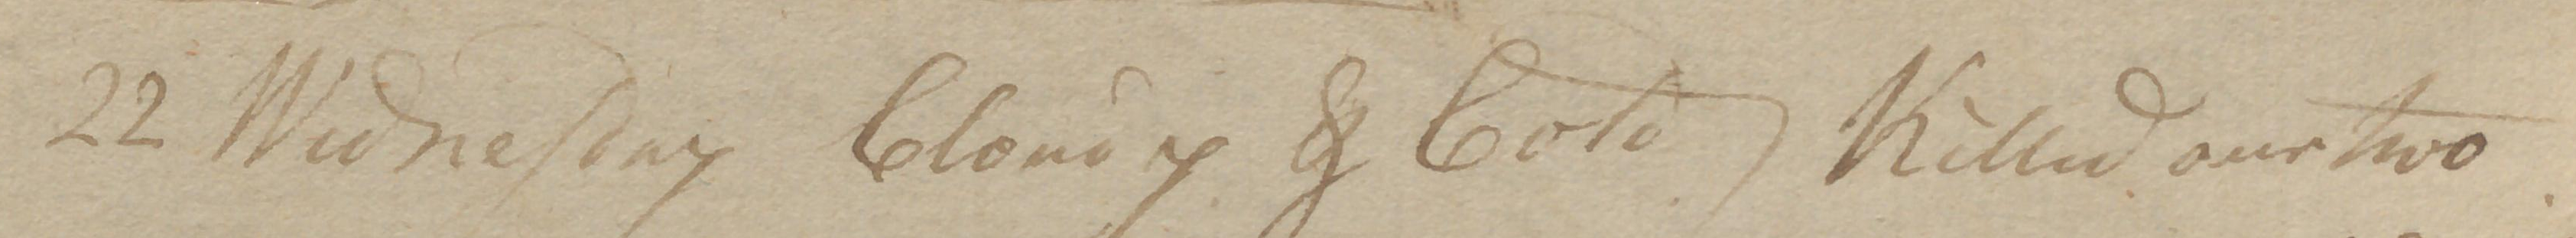22 Wednesday Cloudy & Cold Killed our two
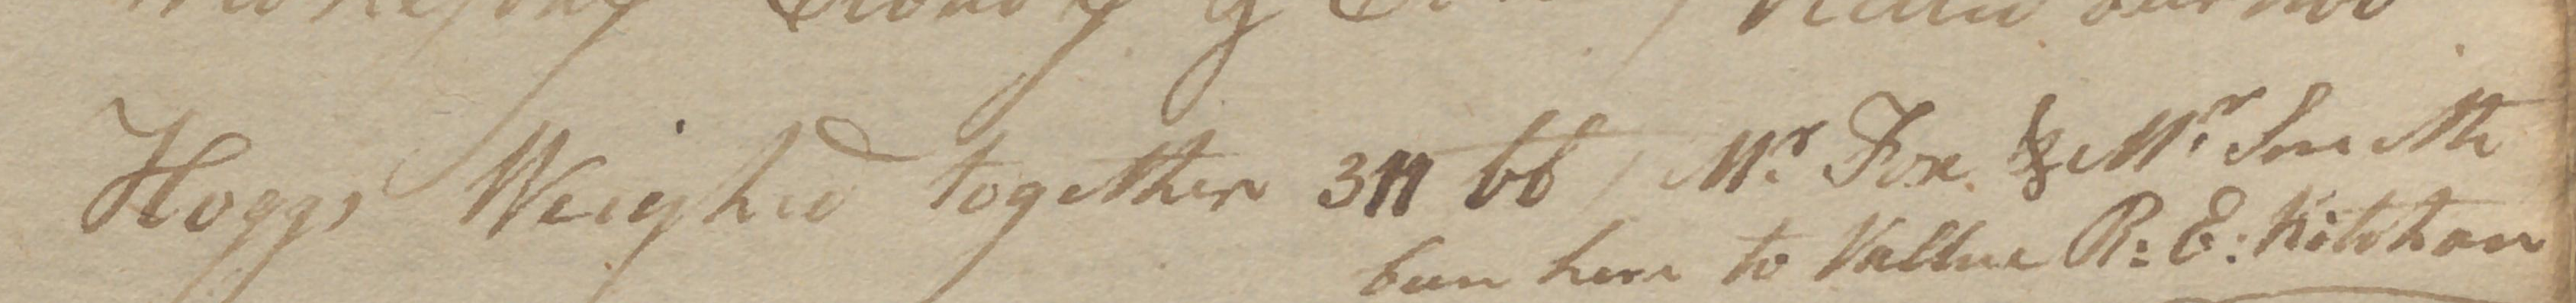Hoggs Weighed together 311 lb M^r. Fox & M^r. Smith
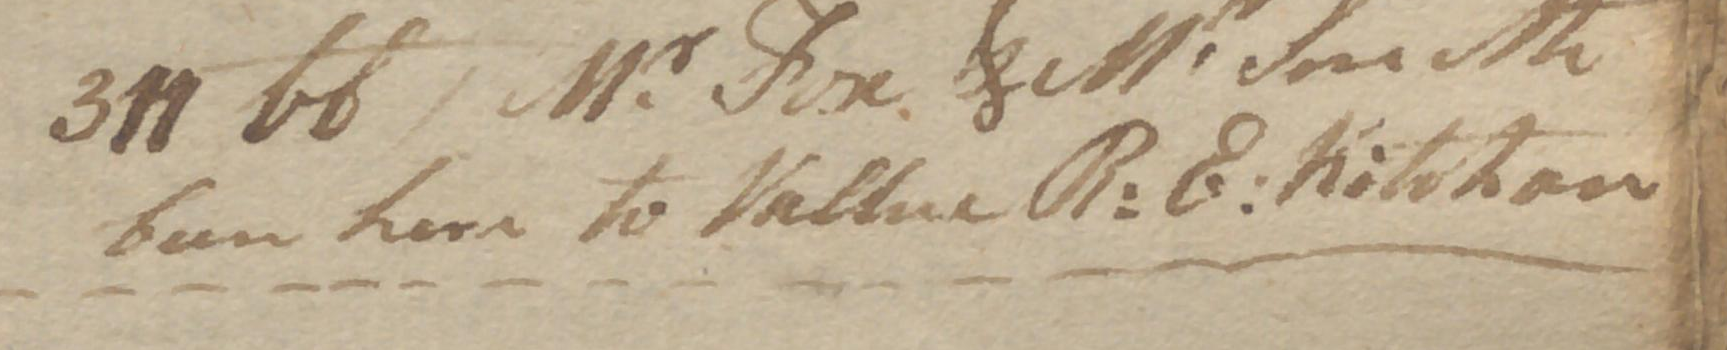been her to Vallue R: E: Kitchen
